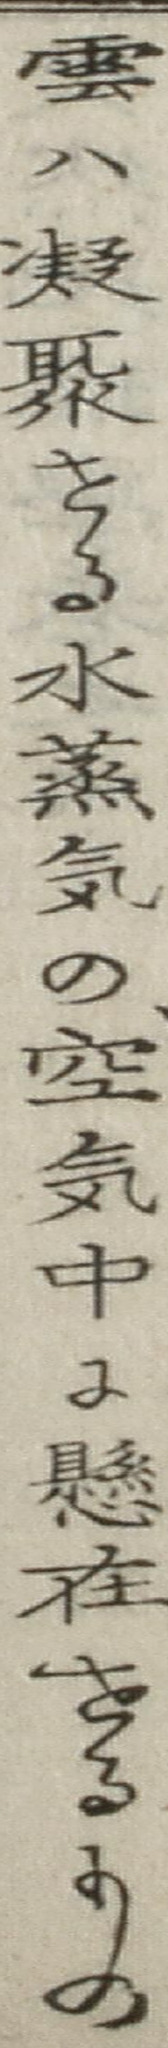雲は凝聚せる水蒸気の、空気中に懸在せるもの
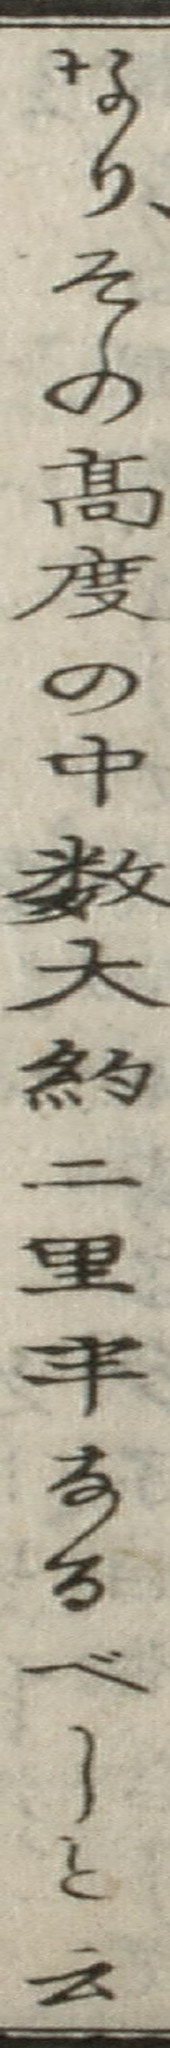なり、その高度の中数大約二里半なるべしと云
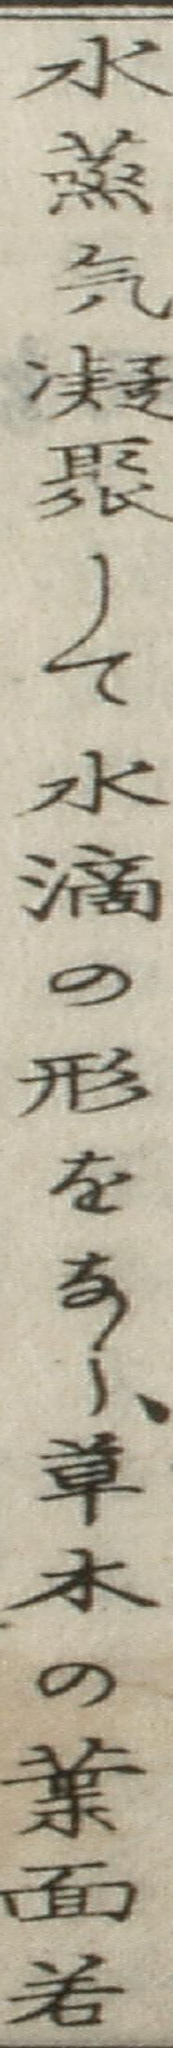水蒸気凝聚して、水滴の形をなし、草木の葉面若
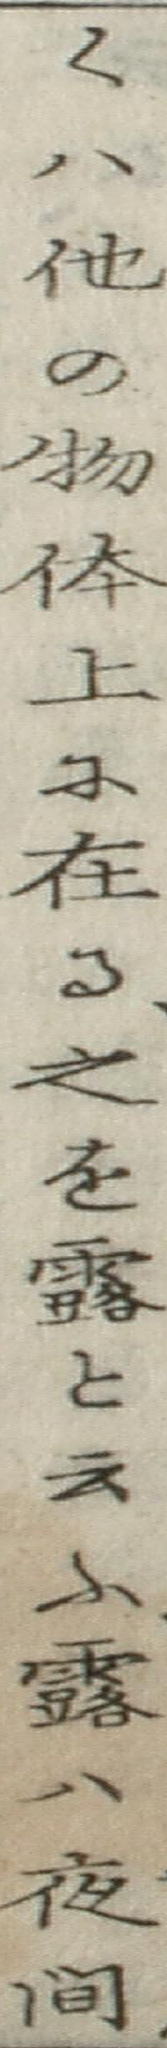くは他の物体上に在る、之を露と云ふ、露は夜間
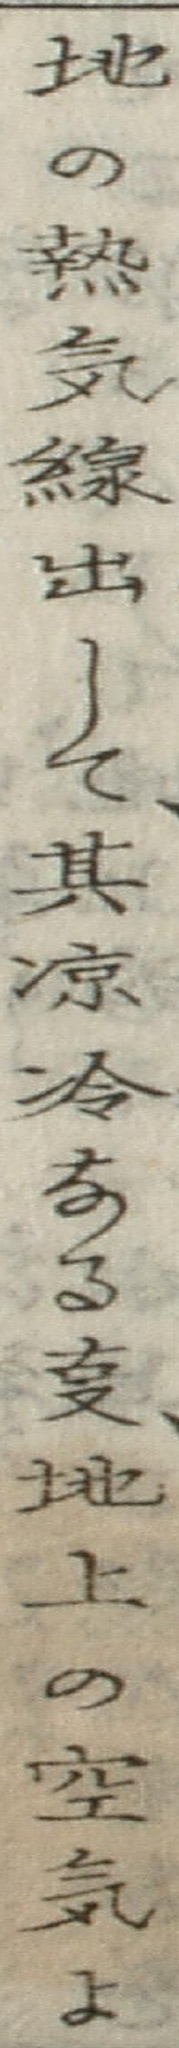地の熱気線出して、其凉冷なる事、地上の空気よ
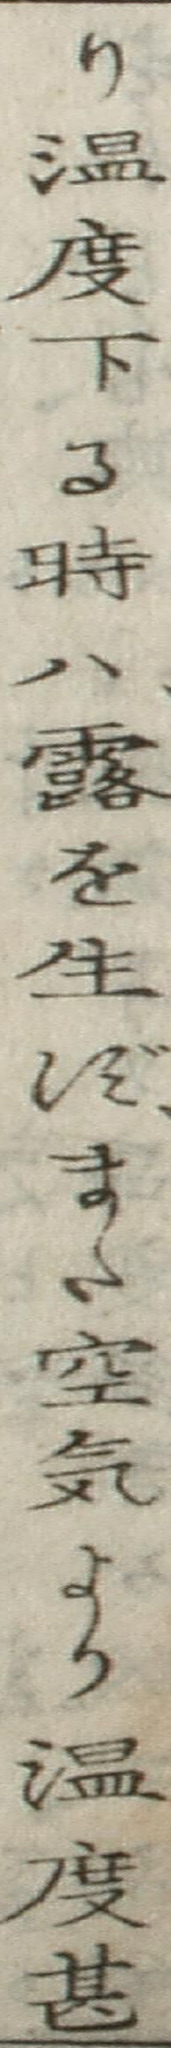り温度下る時は、露を生ず、また空気より温度甚
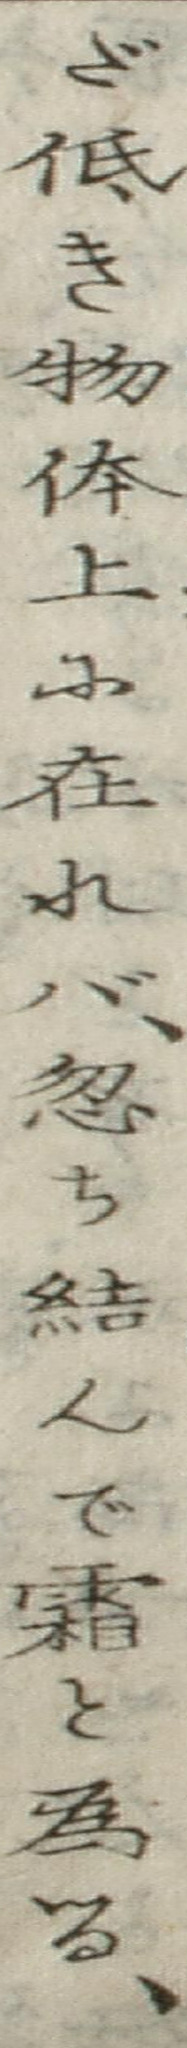だ低き物体上に在れば、忽ち結んで霜と為る、

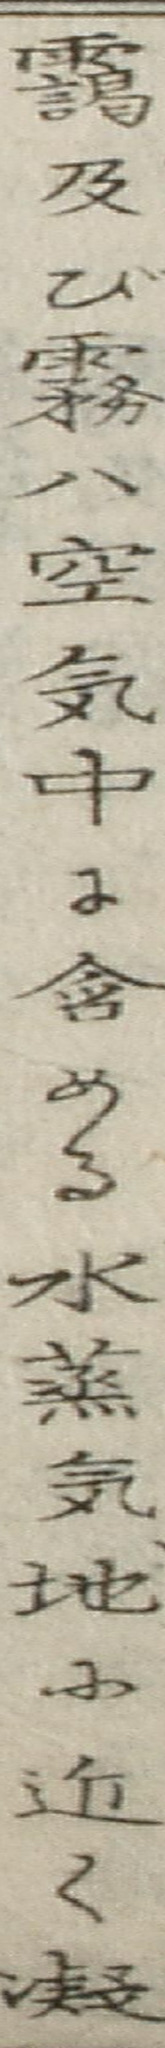靄及び霧は空気中に含める水蒸気、地に近く凝
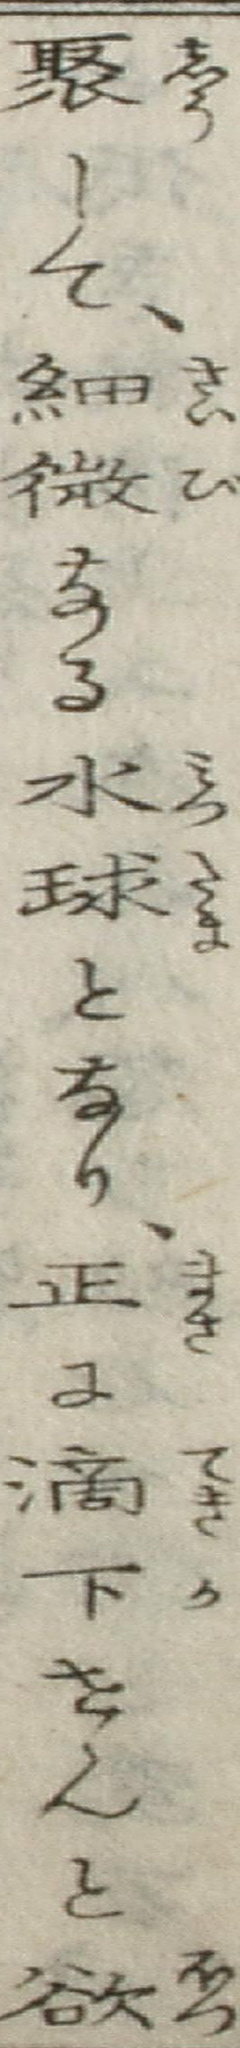聚して、細微なる水球となり、正に滴下せんと欲
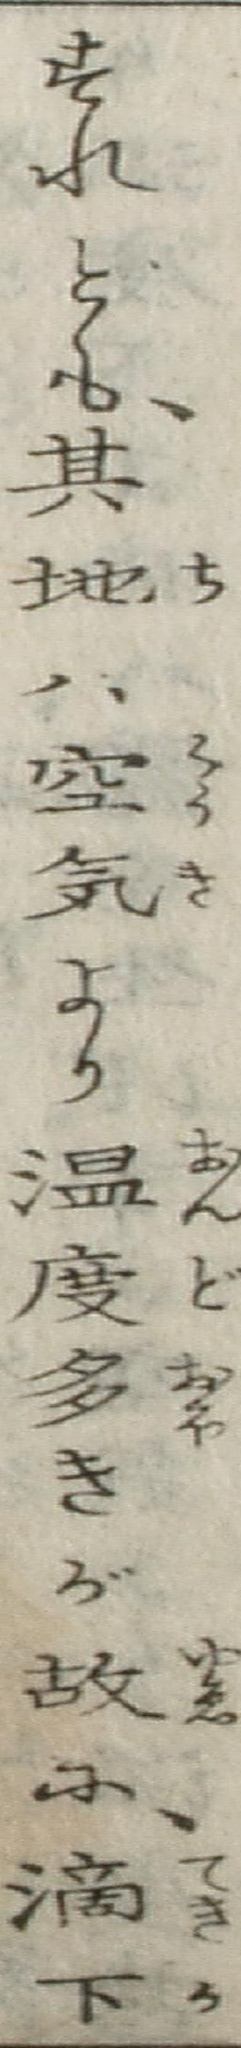すれども、其地は空気より温度多きが故に、滴下
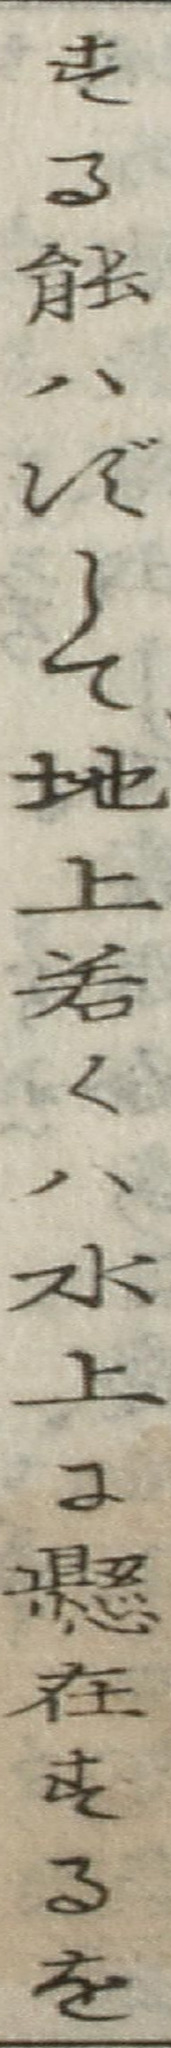する能はずして、地上若くは水上に懸在するを
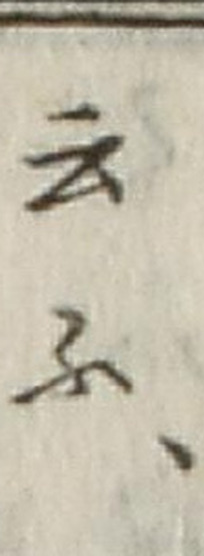云ふ、
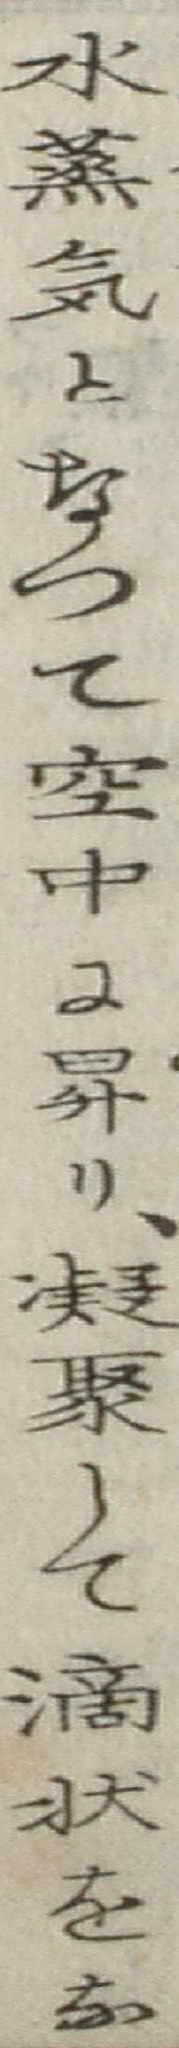水蒸気となつて空中に昇り、凝聚して滴状をな
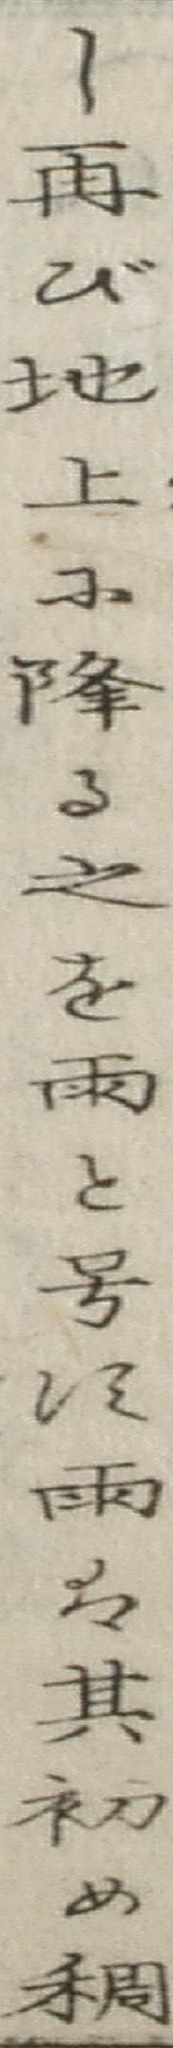し再び地上に降る之を雨と号す、雨は其初め稠
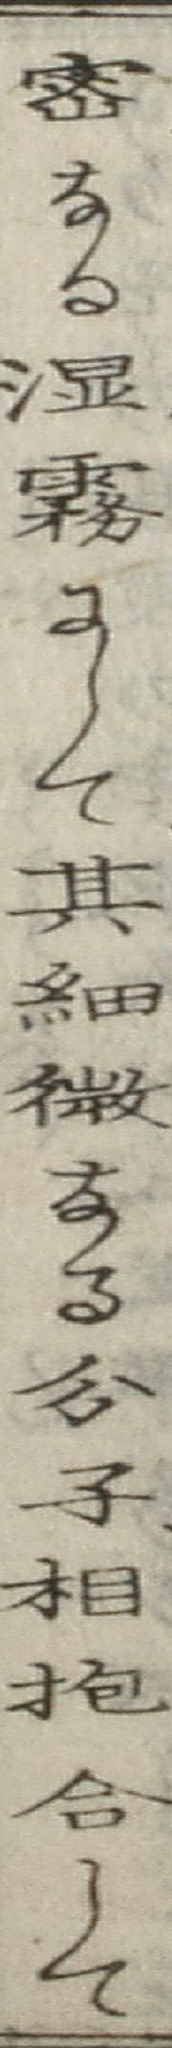みつ）する湿霧にして、其細微なる分子、相抱合して
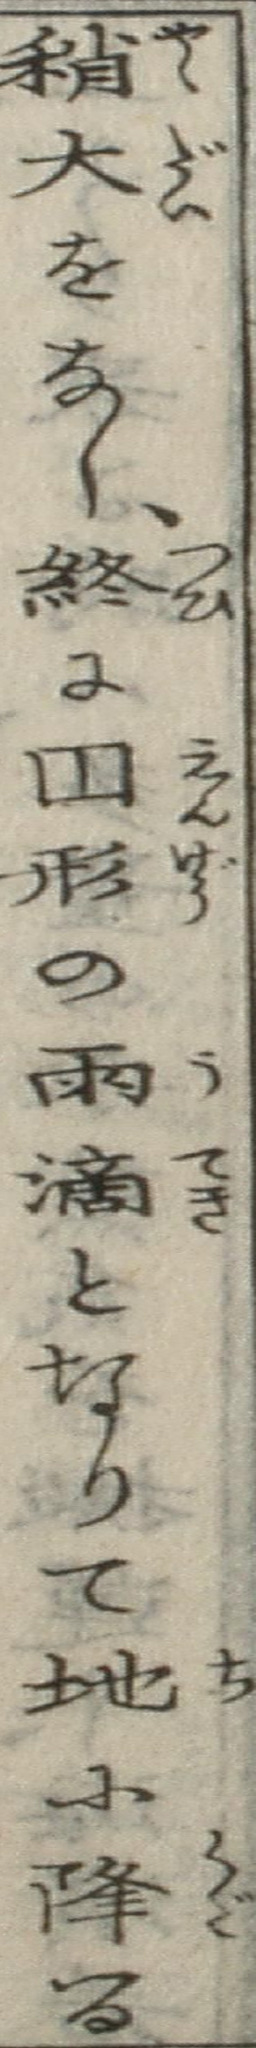稍大をなし、終に円形の雨滴となりて地に降る
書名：訓蒙　天然地理學　下
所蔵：東京大学地震研究所図書室 Earthquake Research Institute Library, The University of Tokyo, JAPAN
